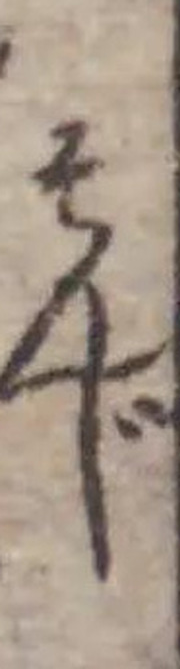そんじ
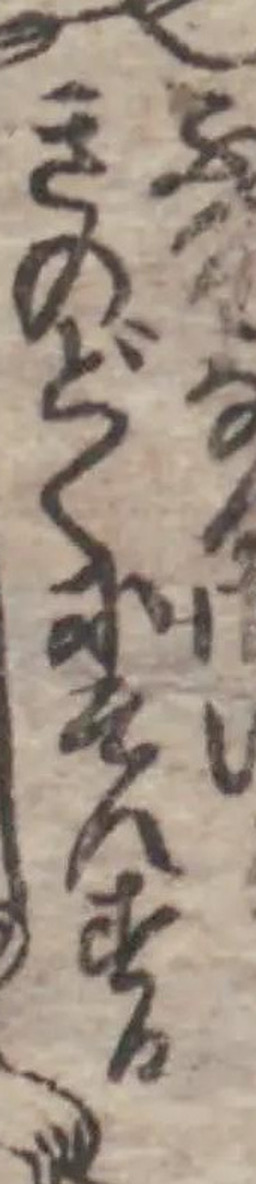きのどくにそんする
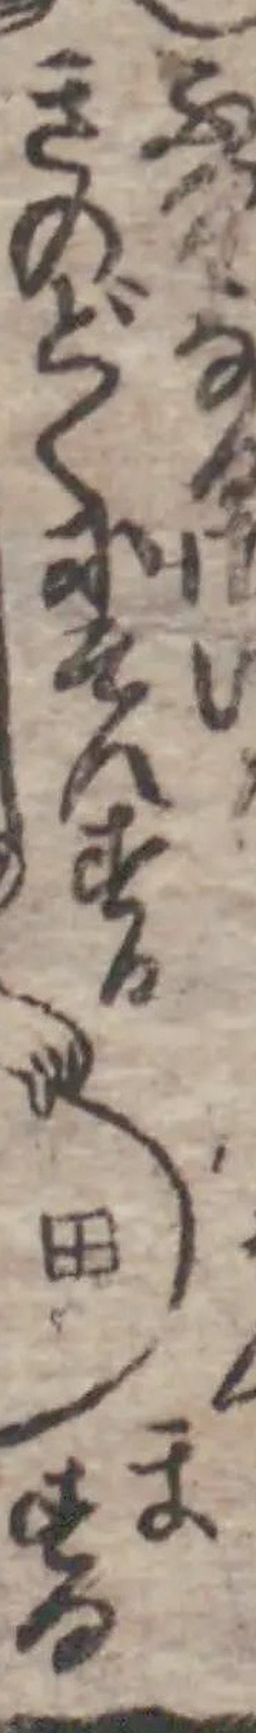きのどくにそんする
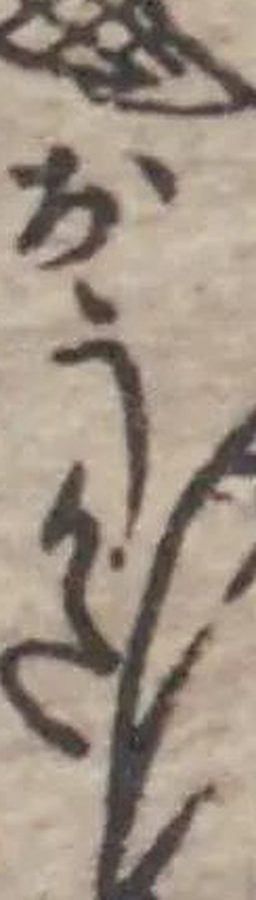おうかた
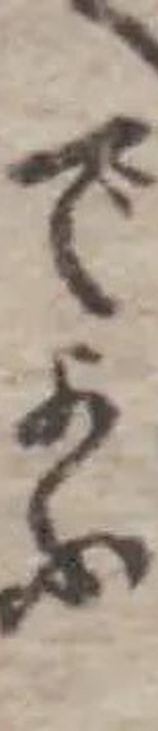でよふ
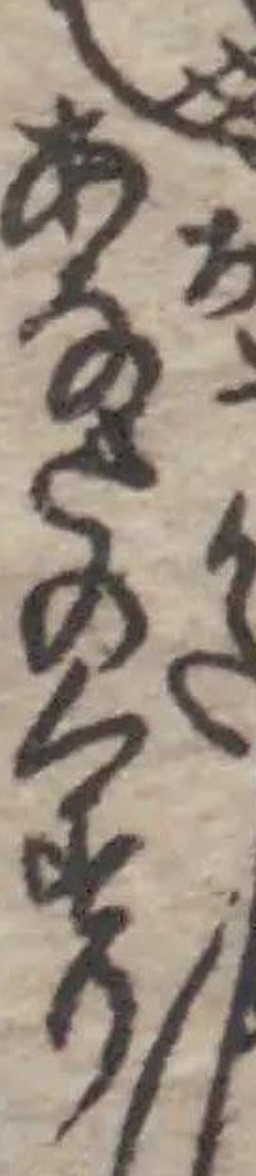あなたのくすり
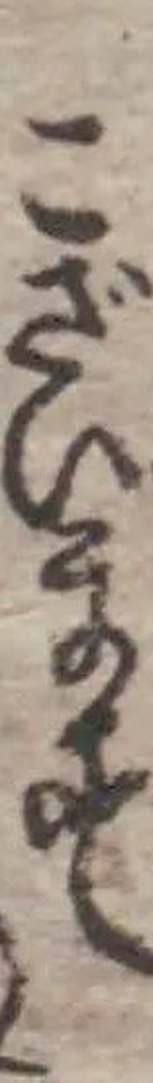ございます
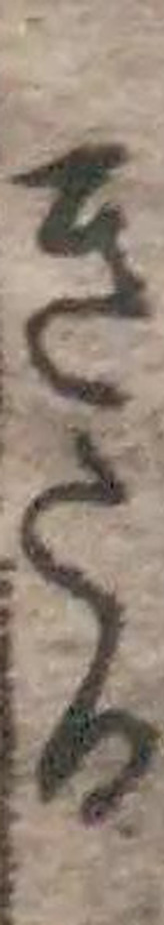きたる

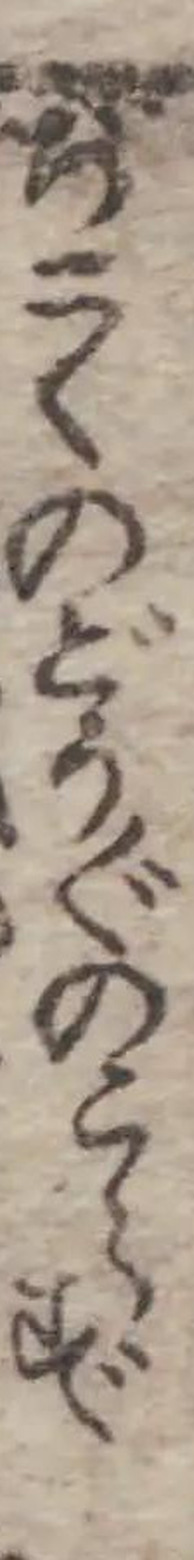ぢこくのどうぐのこらず
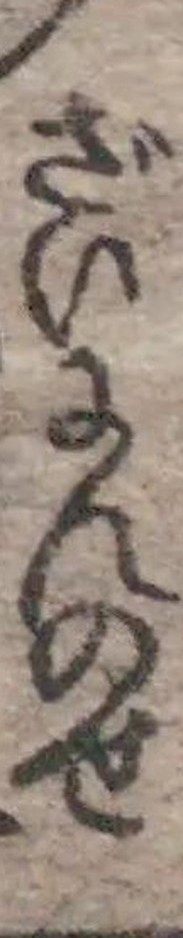ざいにんのせ
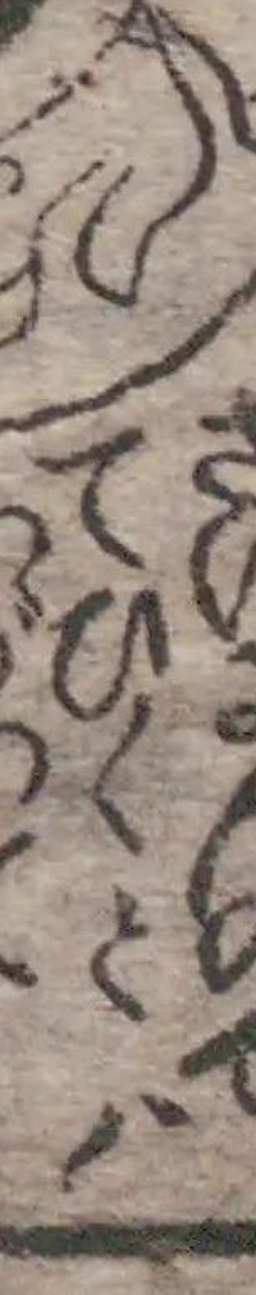てひくとは
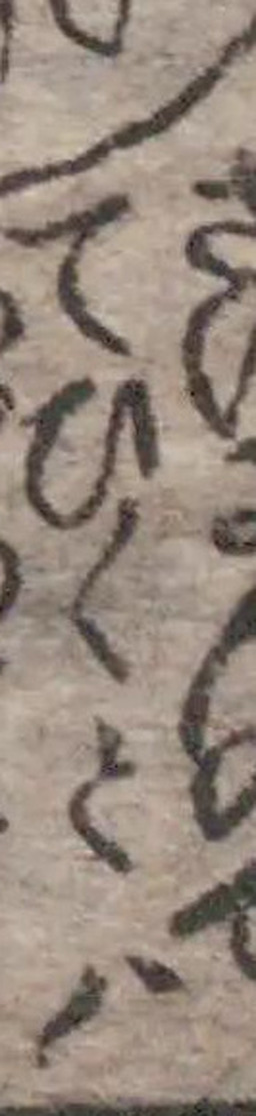てひくとは
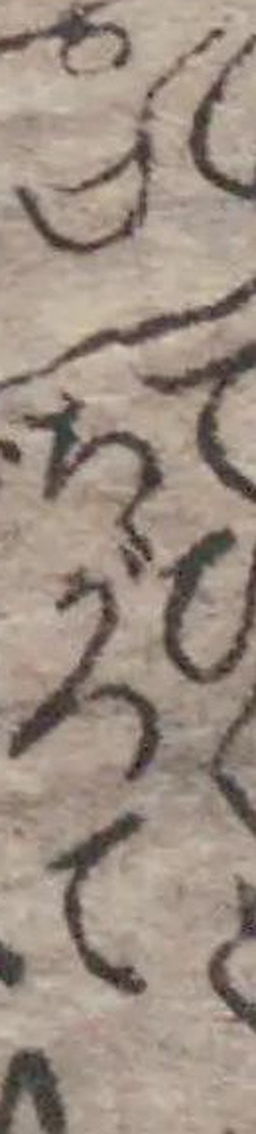ちがつて
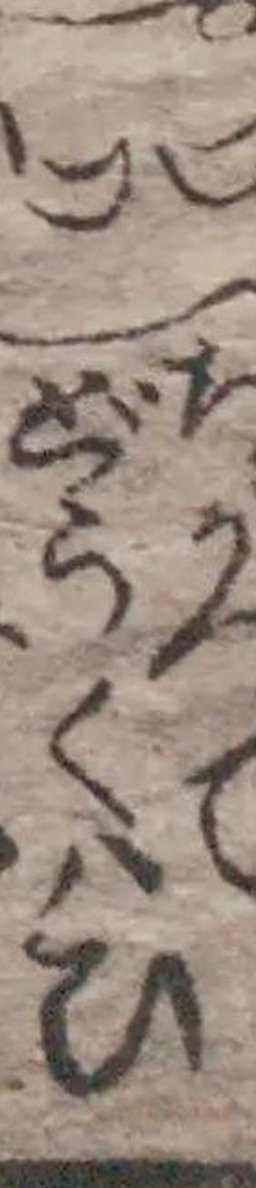どうくはひ
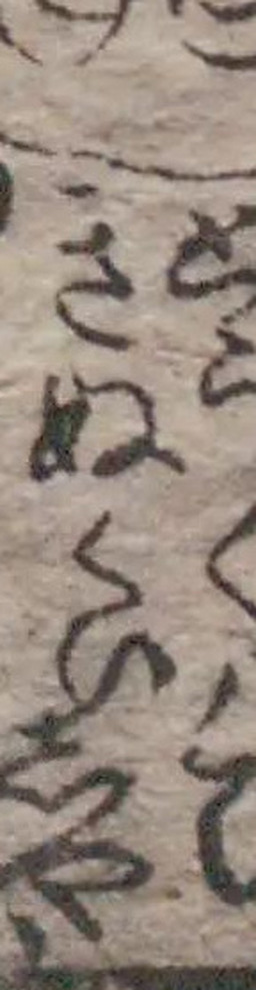きぬくいしやは
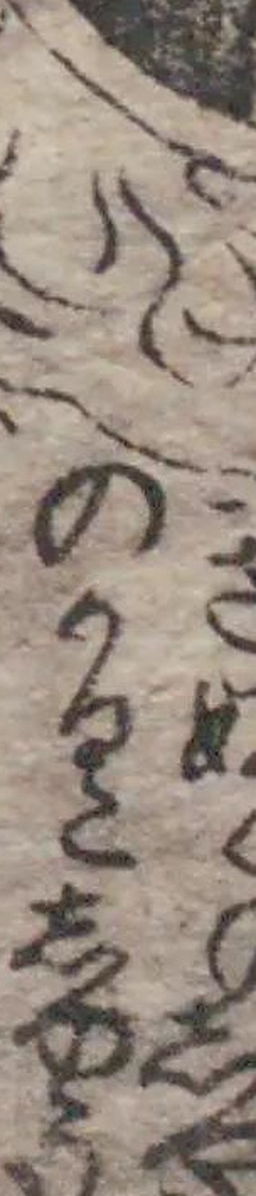のかるこしやうは
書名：大磯地蔵咄 2巻
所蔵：国立国会図書館 National Diet Library, JAPAN
